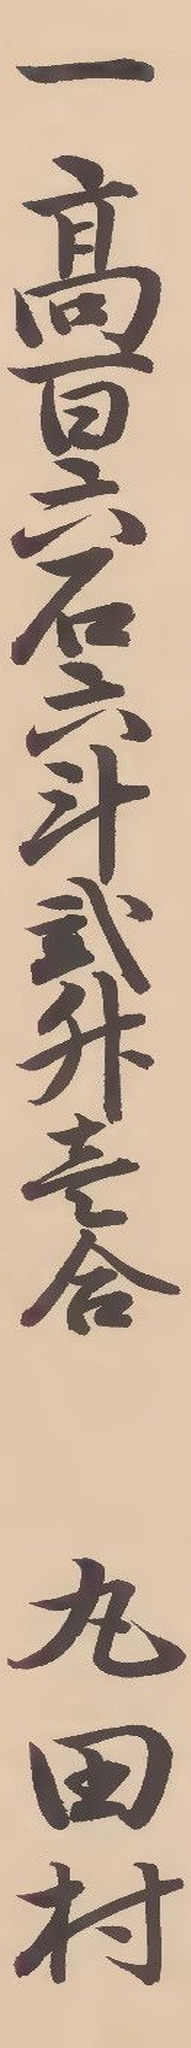一高百六石六斗弐升壱合丸田村

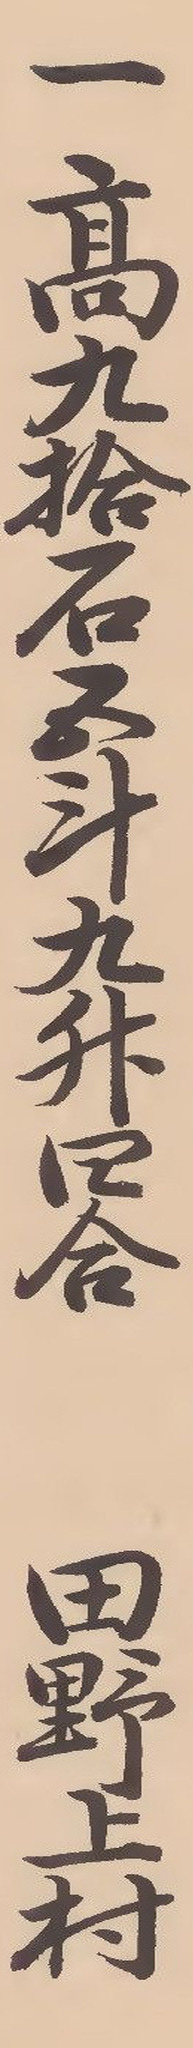一高九拾石五斗九升四合田野上村
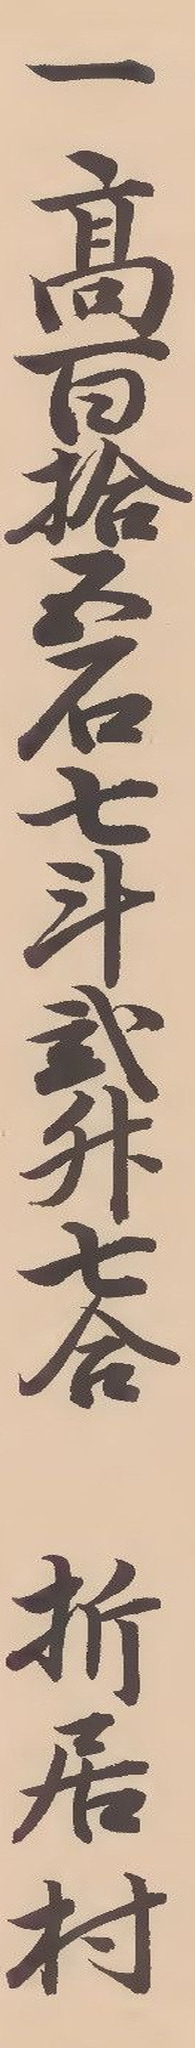一高百拾五石七斗弐升七合折居村
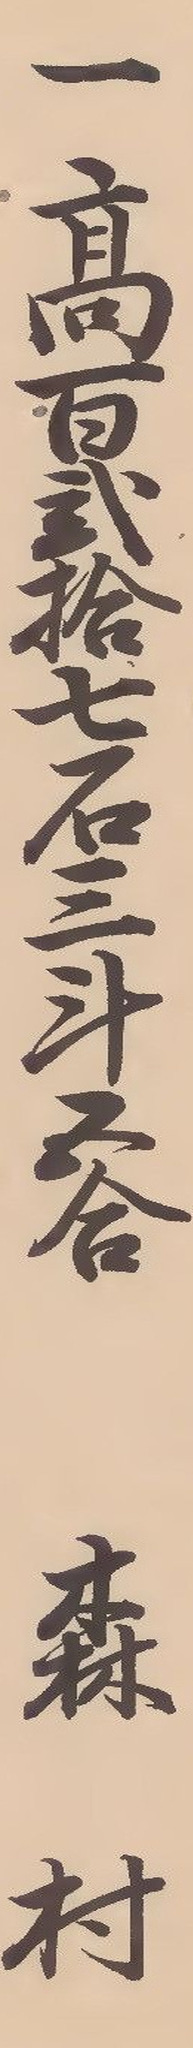一高百弐拾七石三斗五合森村
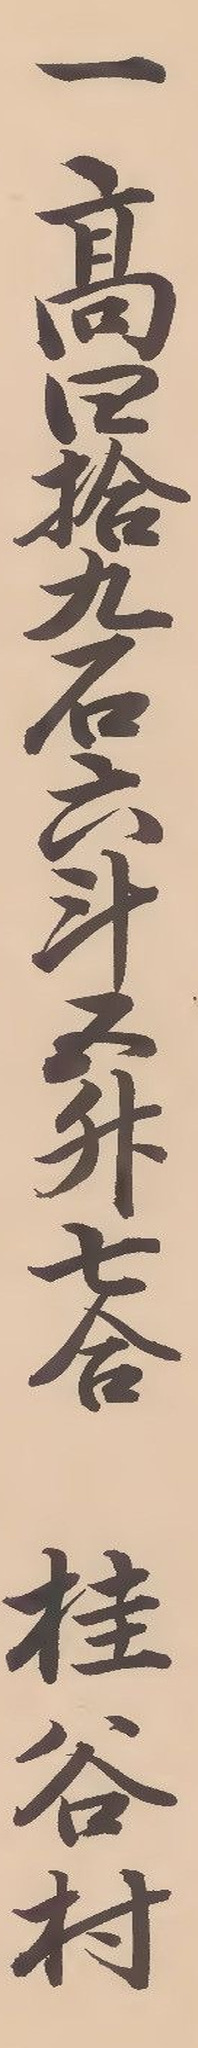一高四拾九石六斗五升七合桂谷村
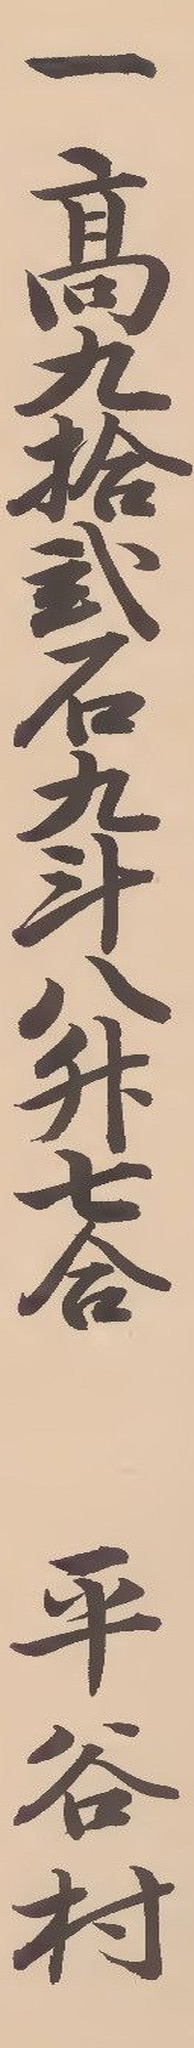一高九拾弐石九斗八升七合平谷村
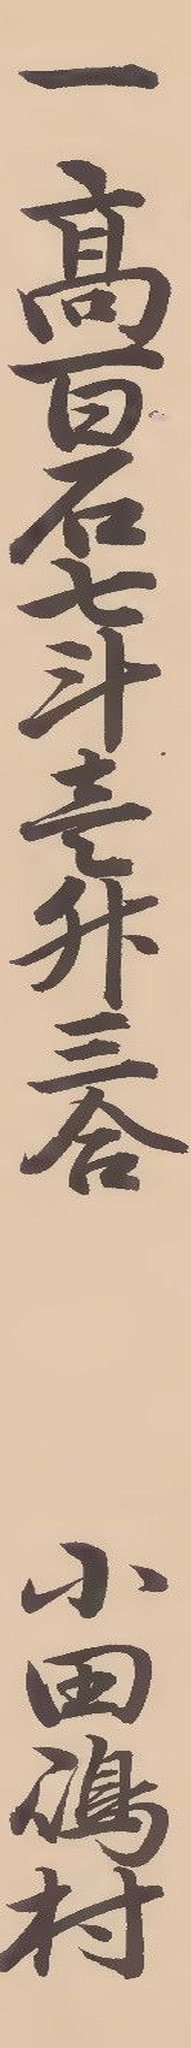一高百石七斗壱升三合小田島村
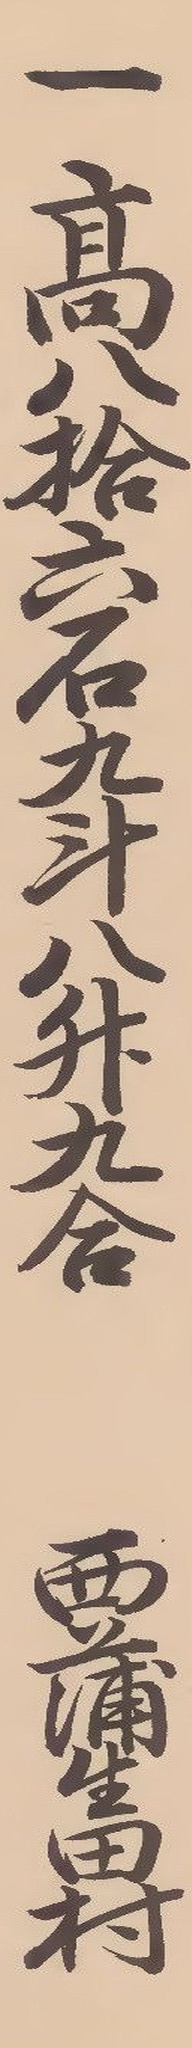一高八拾六石九斗八升九合西蒲生田村
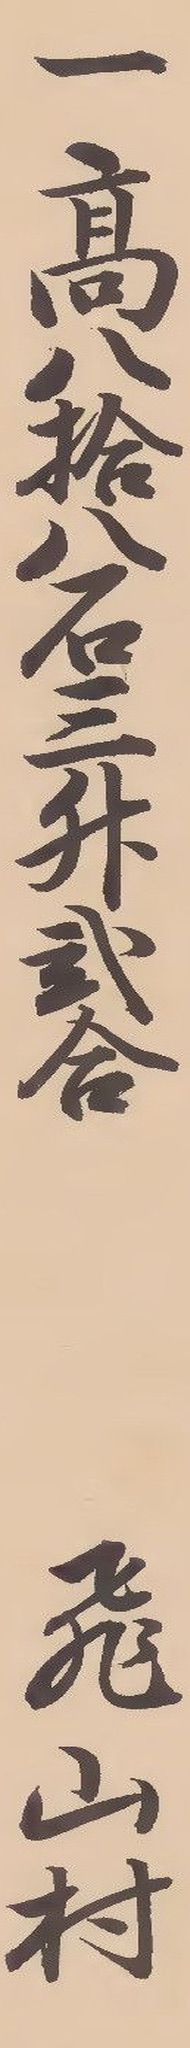一高八拾八石三升弐合飛山村

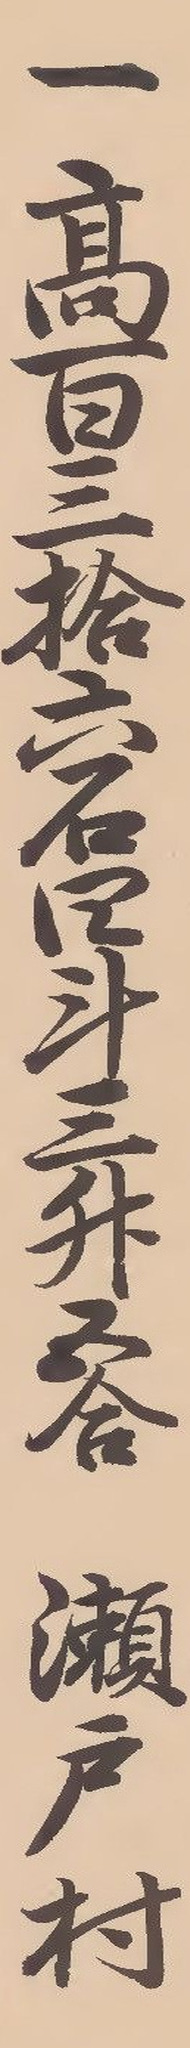一高百三拾六石四斗三升五合瀬戸村
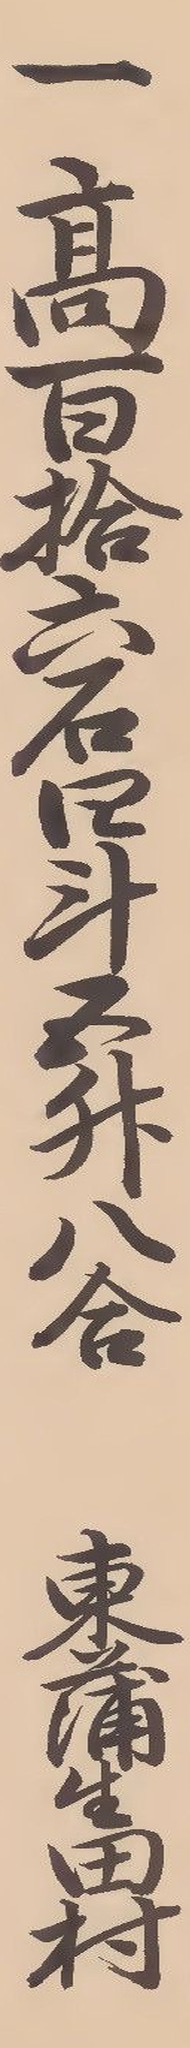一高百拾六石四斗五升八合東蒲生田村
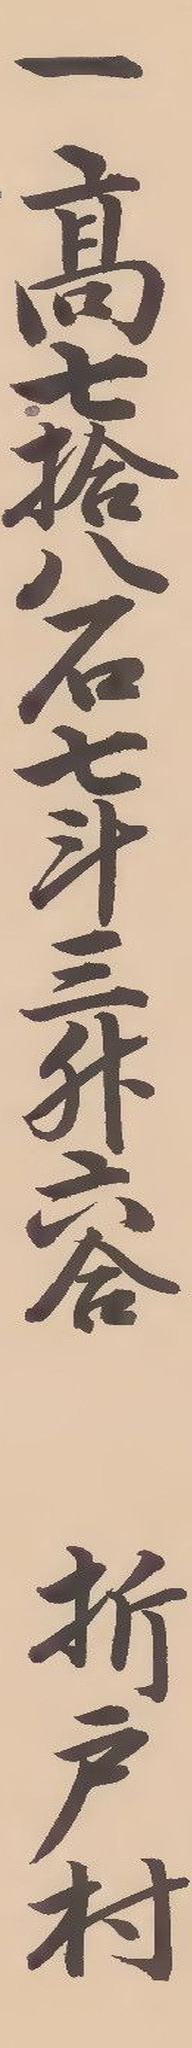一高七拾八石七斗三升六合折戸村
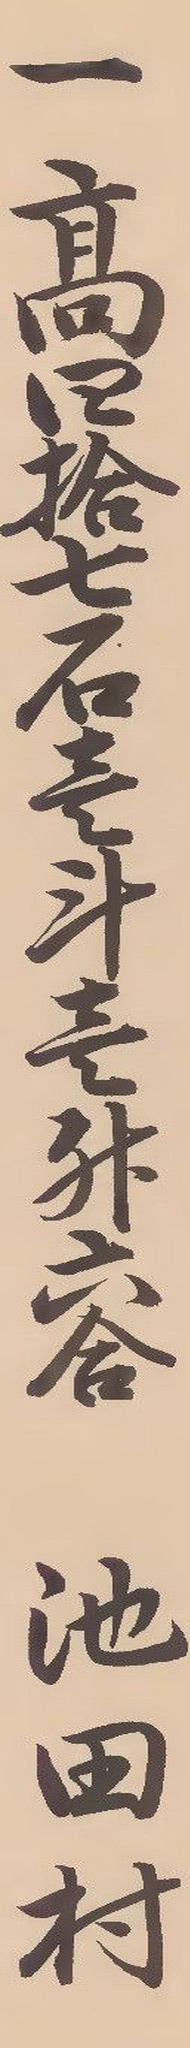一高四拾七石壱斗壱升六合池田村
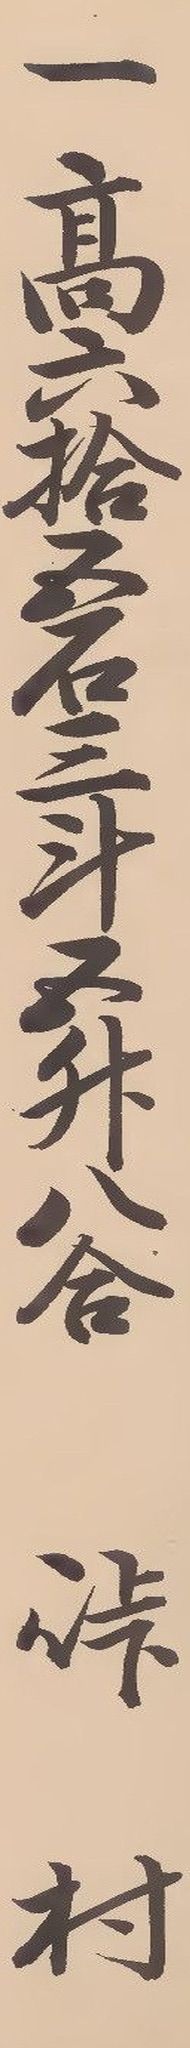一高六拾五石三斗五升八合峠村
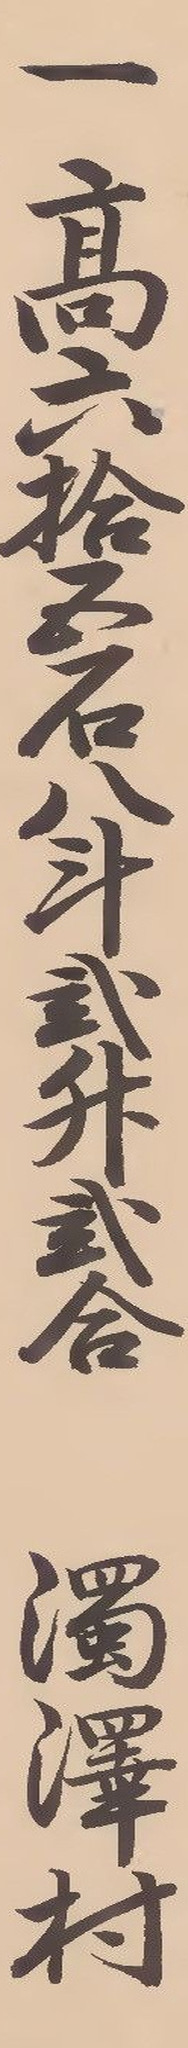一高六拾五石八斗弐升弐合濁沢村
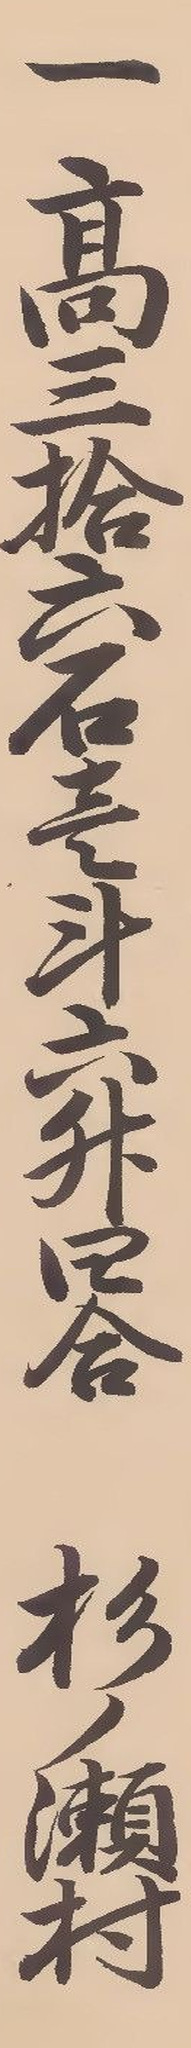一高三拾六石壱斗六升四合杉ノ瀬村
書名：越後国郷帳　上
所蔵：国立公文書館 National Archives of Japan
